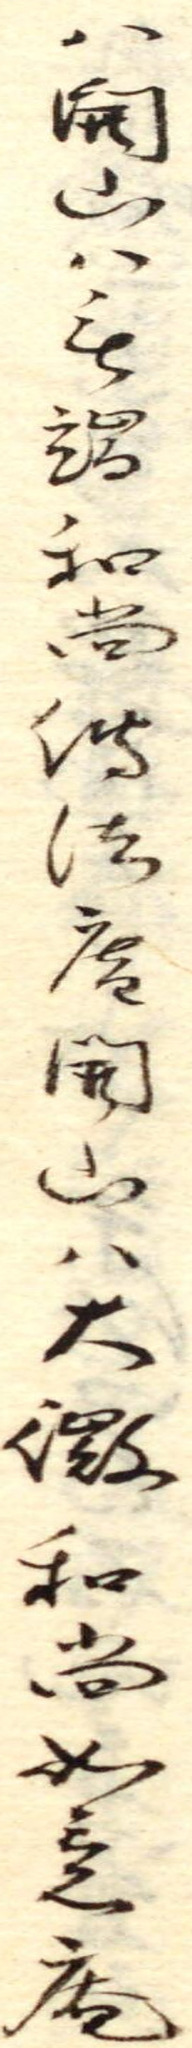は開山は無端和尚伝法庵開山は大徴和尚如意庵
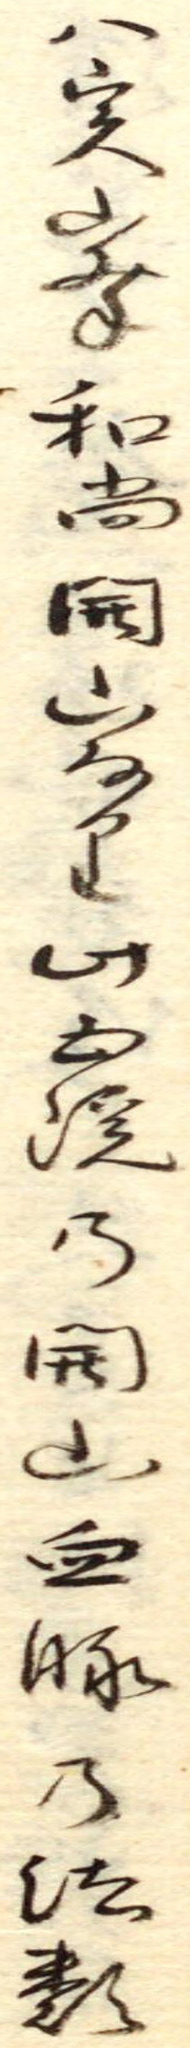は実峯和尚開山なり此五院の開山血脈の法類
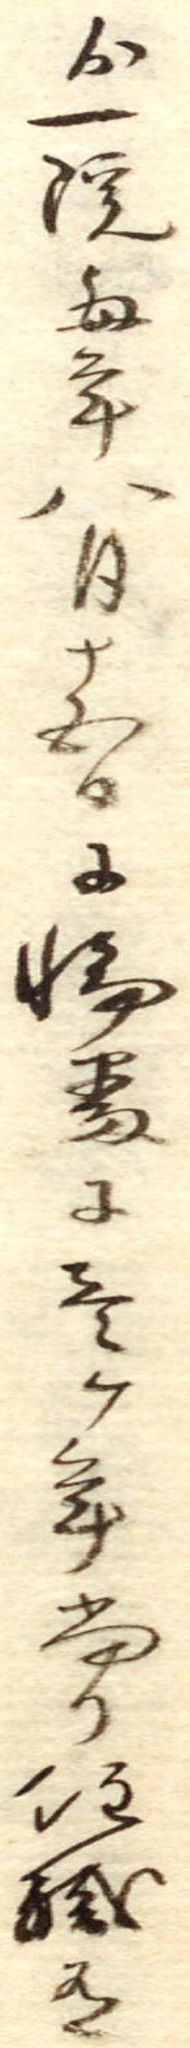ゟ一院毎年八月十五日に輪番に壱ヶ年当り住職有
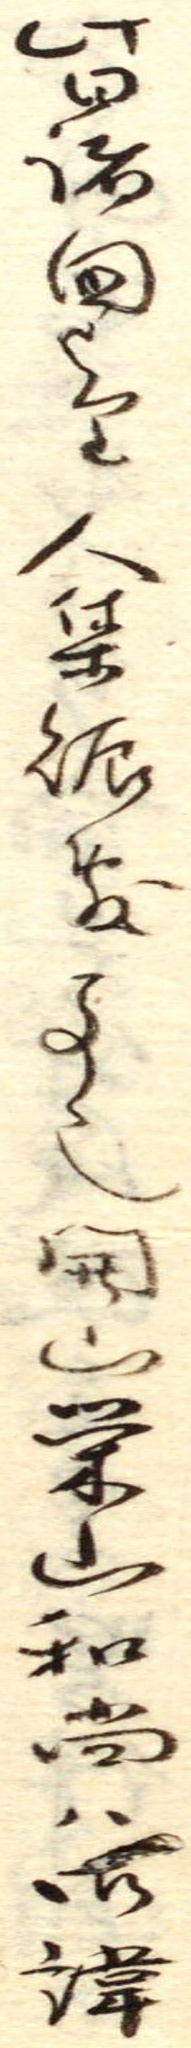此日諸国より人集賑敷事也開山栄山和尚は御諱
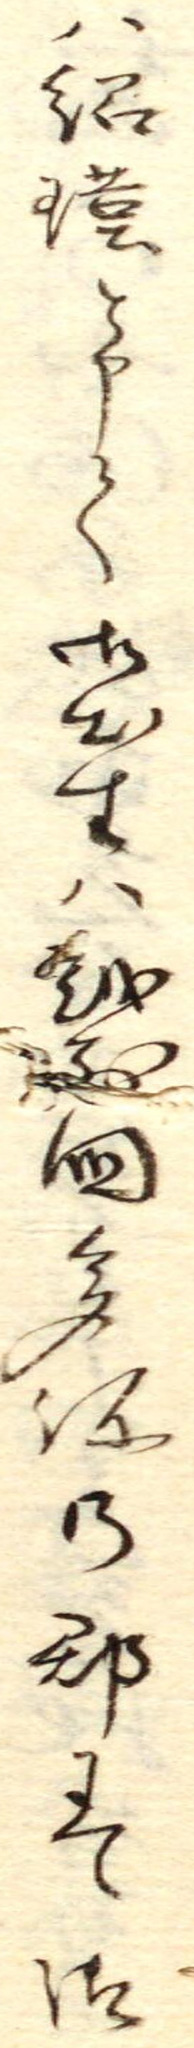は紹瑾と申て御出生は越前国多弥の郡にて御
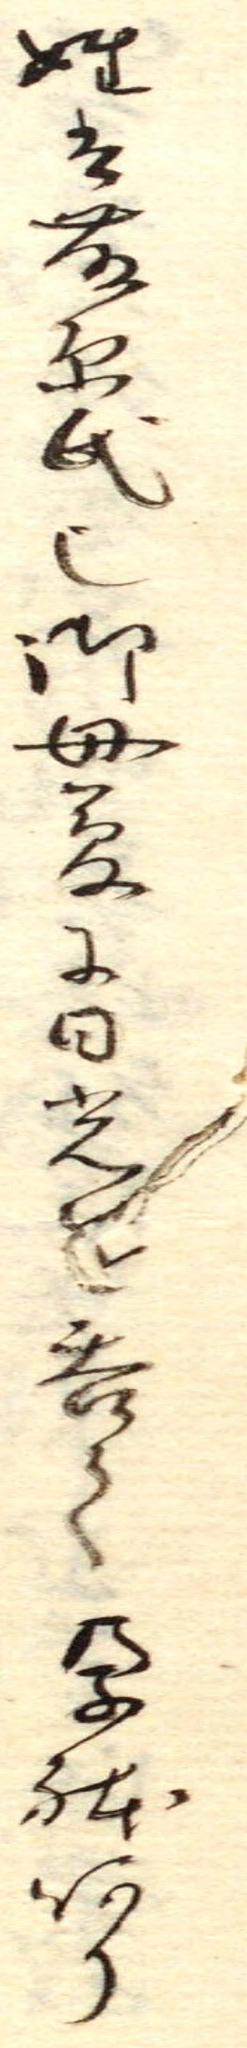姓は藤原氏也御母夢に日光告て孕躰あり
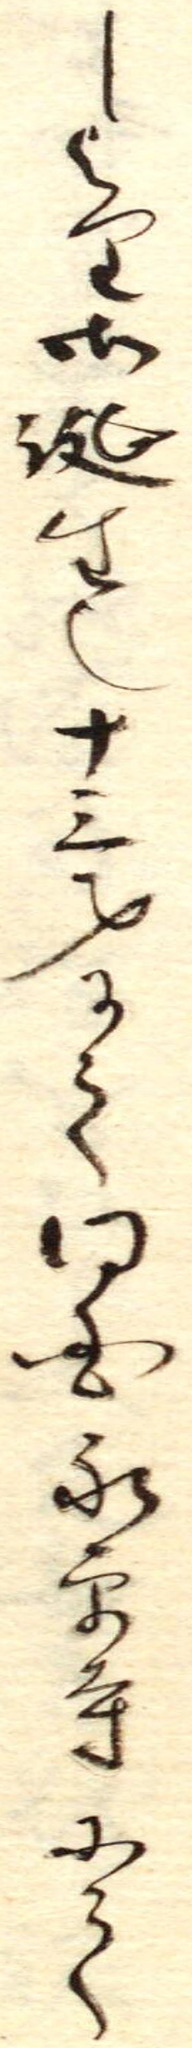しより御誕生也十三才にて同国永平寺にて
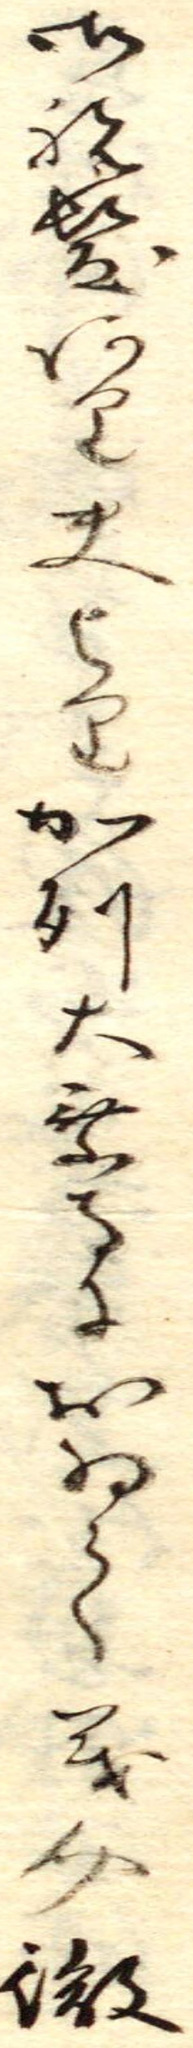御祝髪あり夫より加州大乗寺におゐて義介徹
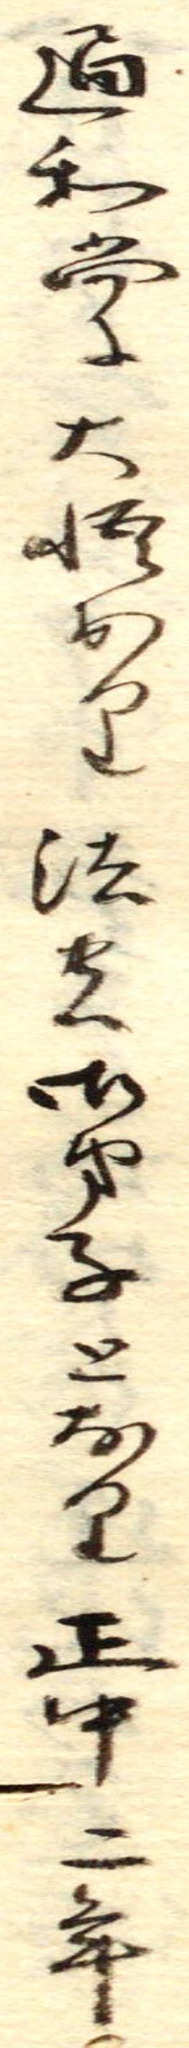通和尚に大悟あり法の御弟子となり正中二年

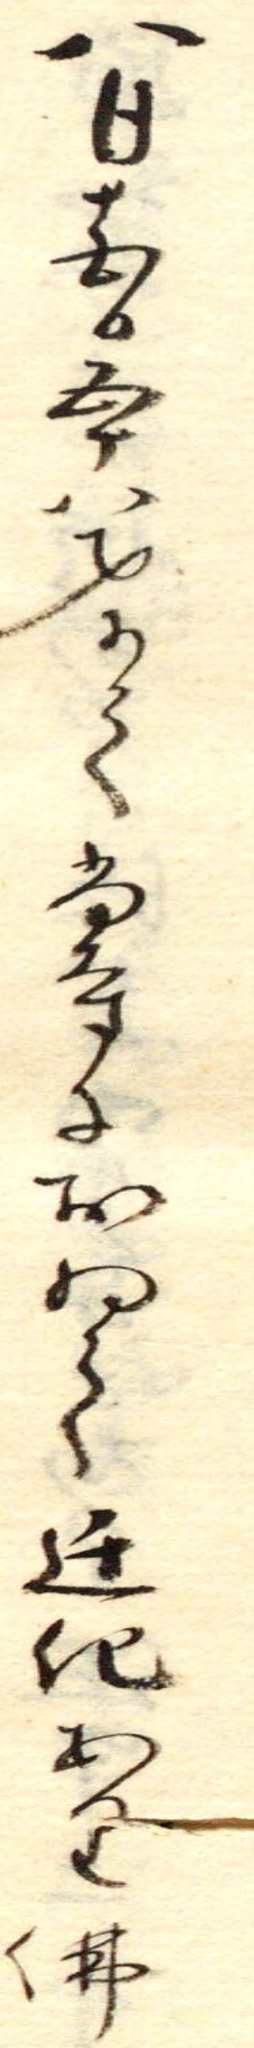八月十五日五十八才にて当寺におゐて遷化あり仏
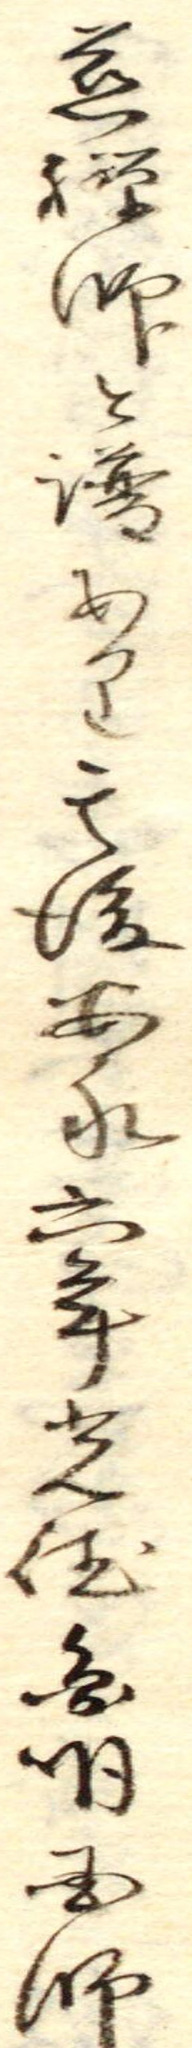慈禅師と譜あり其後安永六年光徳円明国師
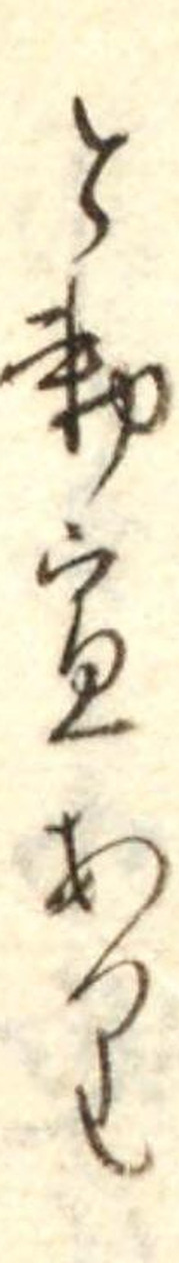と勅宣あり
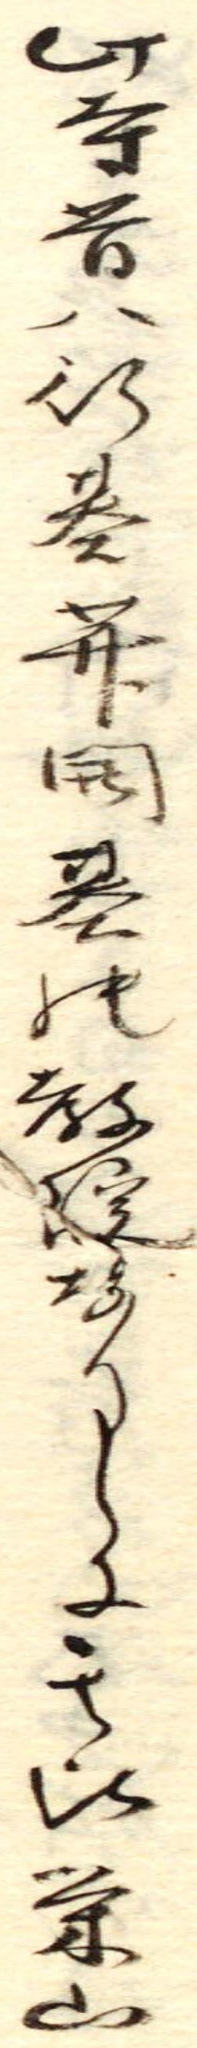此寺昔は行基菩薩開基の教院なりしに其比栄山
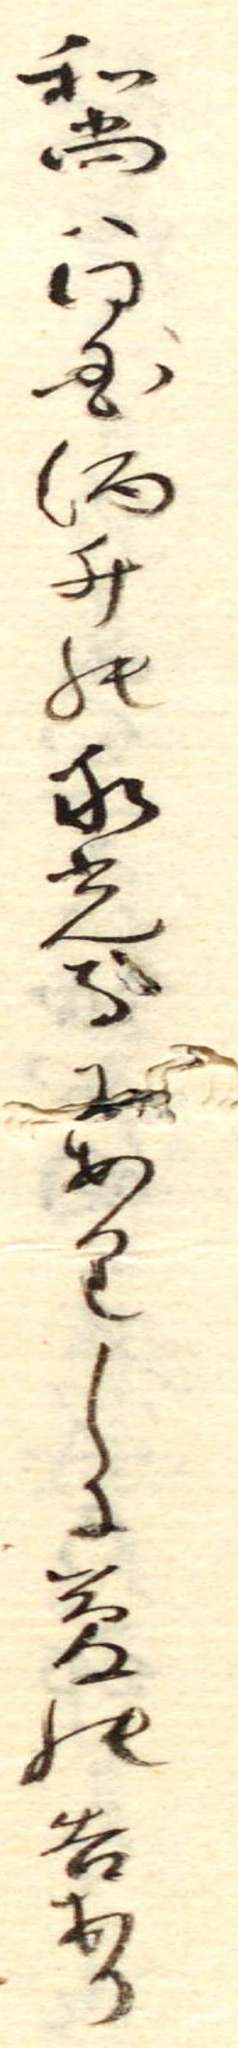和尚は同国酒井の永光寺にありしに夢の告あり
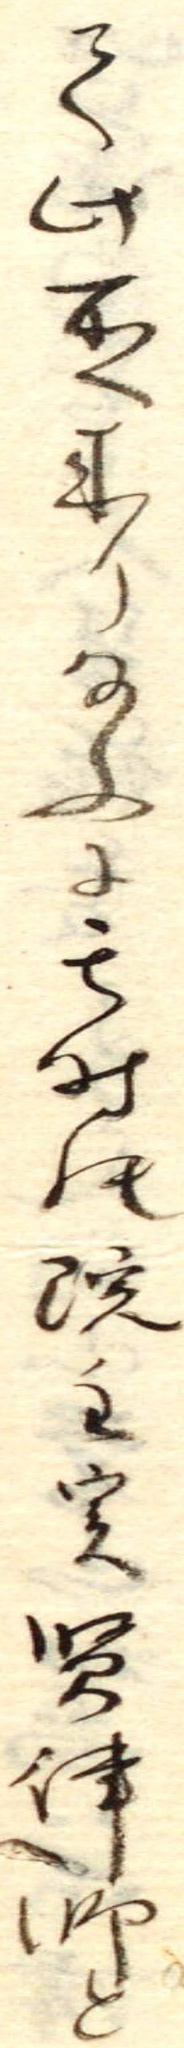て此所へ来り給ふに其時の院主実賢律師と
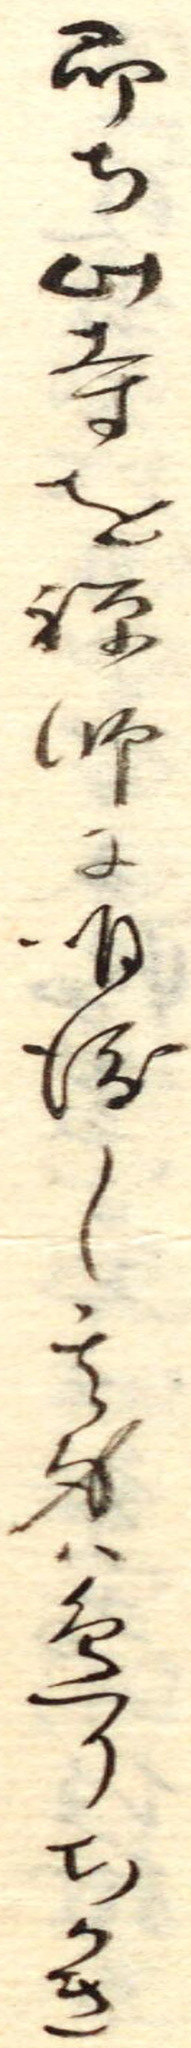即ち此寺を禅師に明渡し其身は辺りちかき
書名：能登名跡誌
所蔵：Ishikawa Prefectural Library
